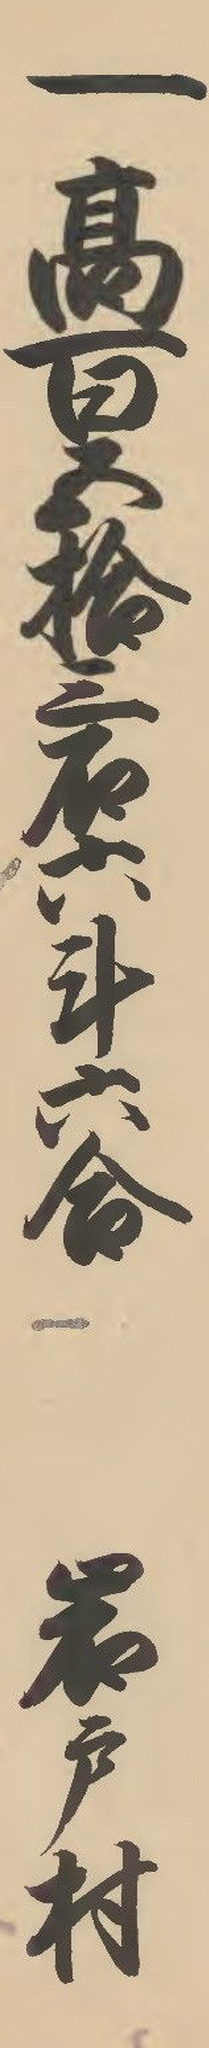一髙百五拾三石六斗六合岩戸村

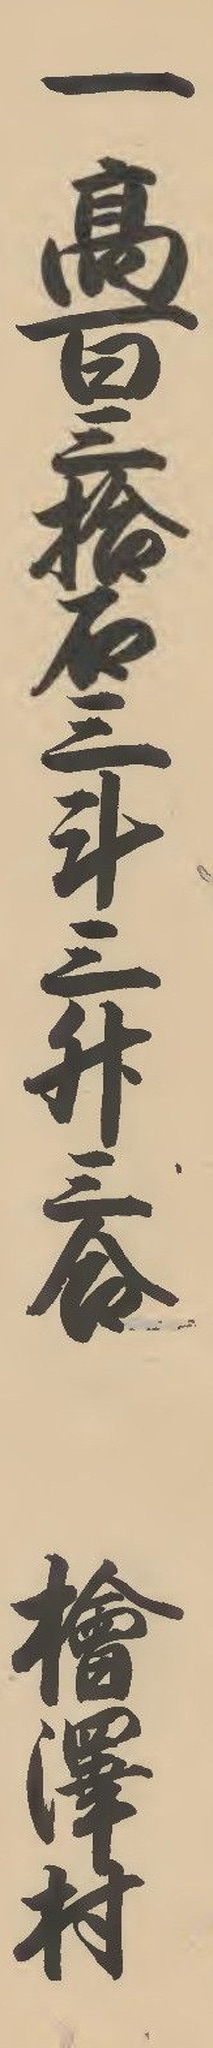一髙百三拾石三斗三升三合檜澤村
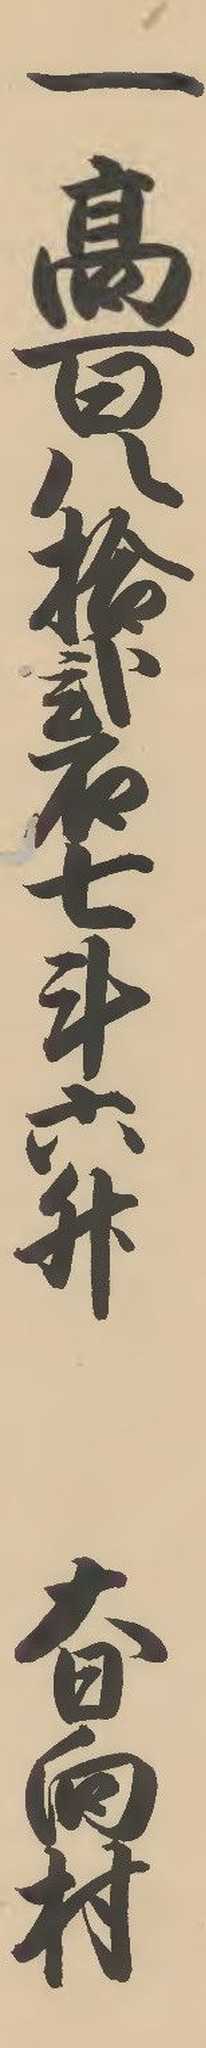一髙百八拾弐石七斗六升大日向村
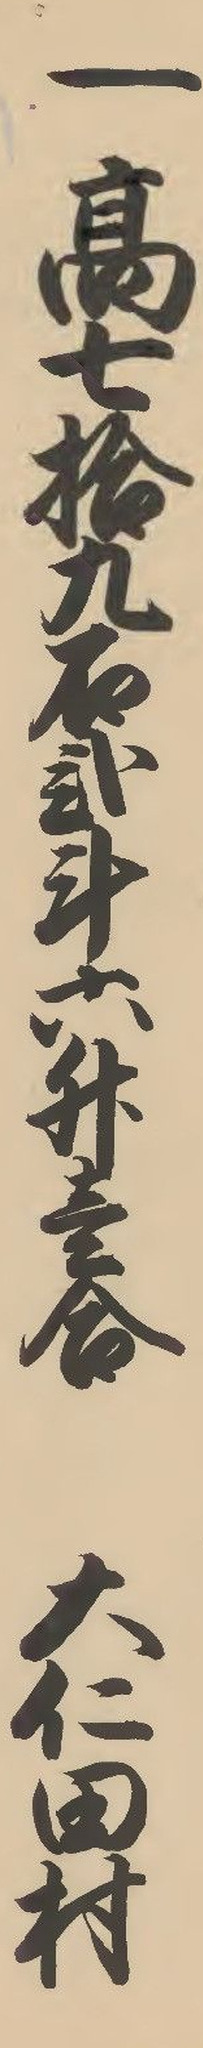一髙七拾九石弐斗六升壱合大仁田村
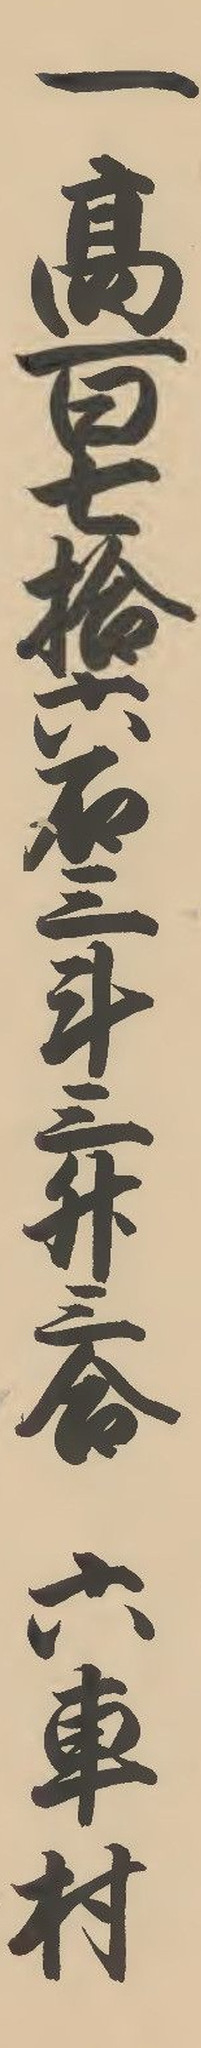一髙百七拾六石三斗三升三合六車村
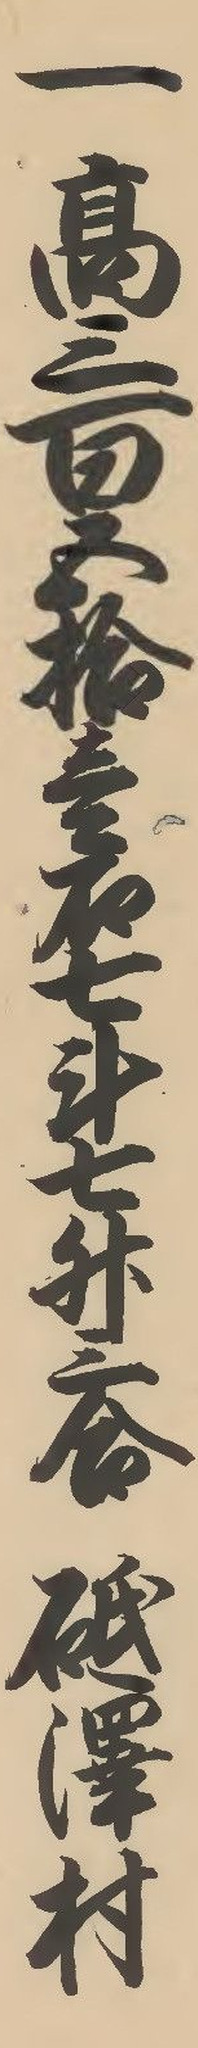一髙三百五拾壱石七斗七升三合砥澤村
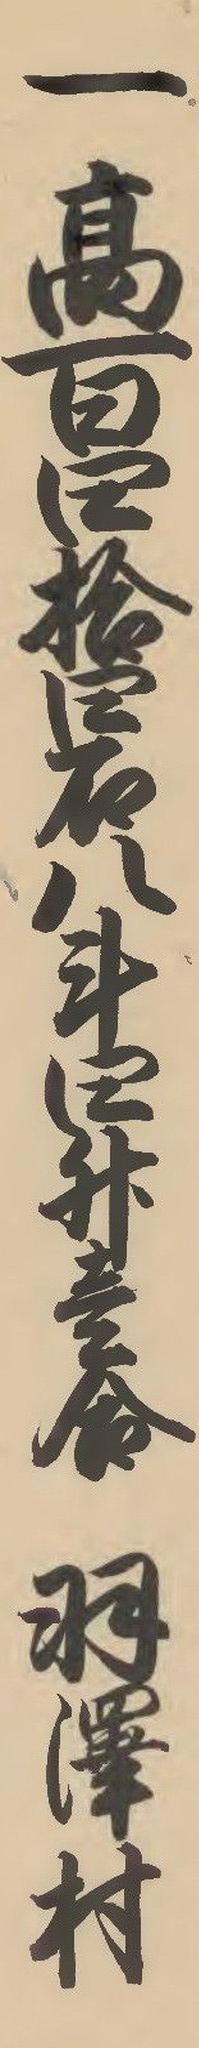一髙百四拾四石八斗四升壱合羽澤村
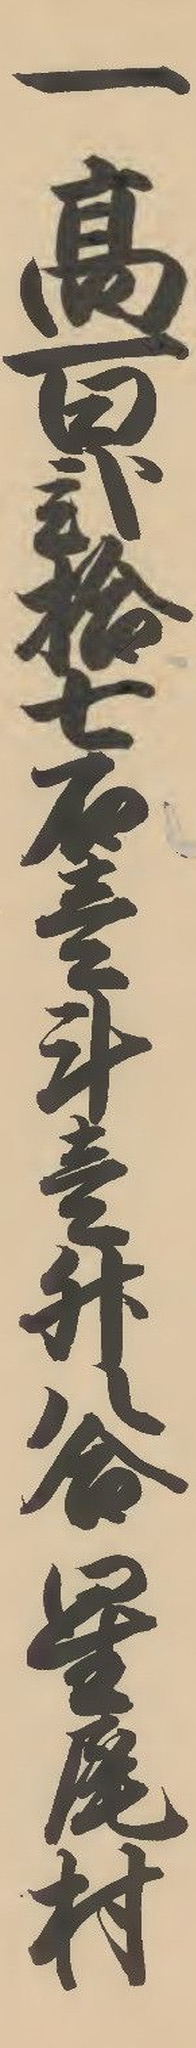一髙百弐拾七石壱斗壱升八合星尾村
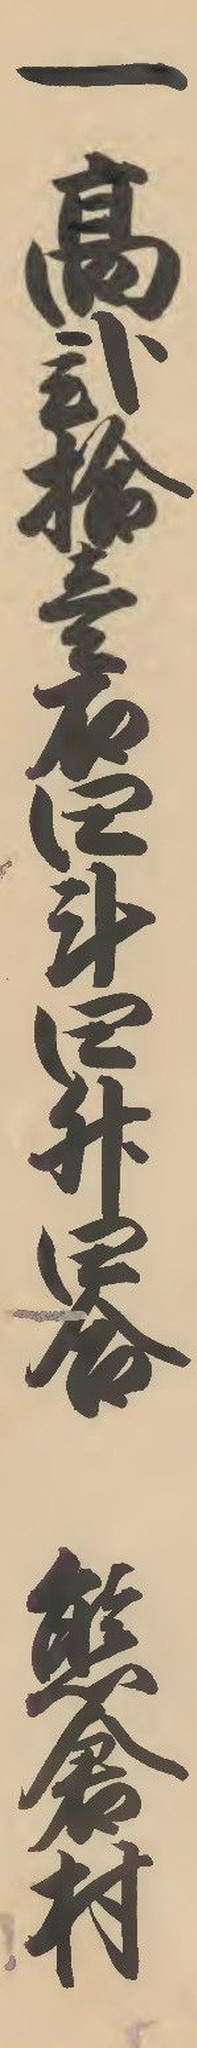一髙弐拾壱石四斗四升四合熊倉村

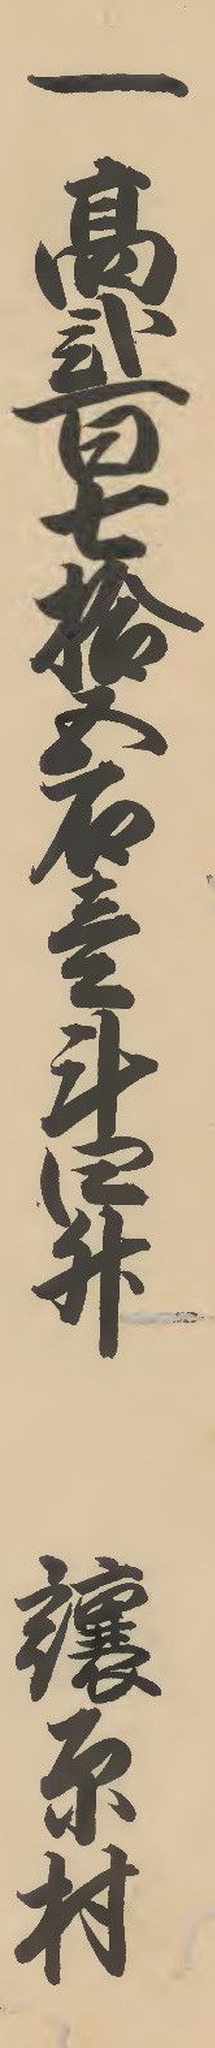一髙弐百七拾五石壱斗四升譲原村
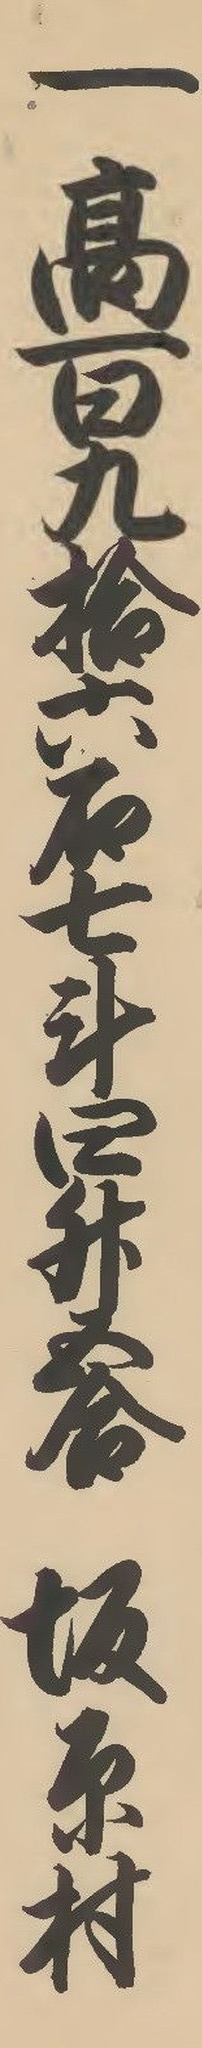一髙百九拾六石七斗四升五合坂原村
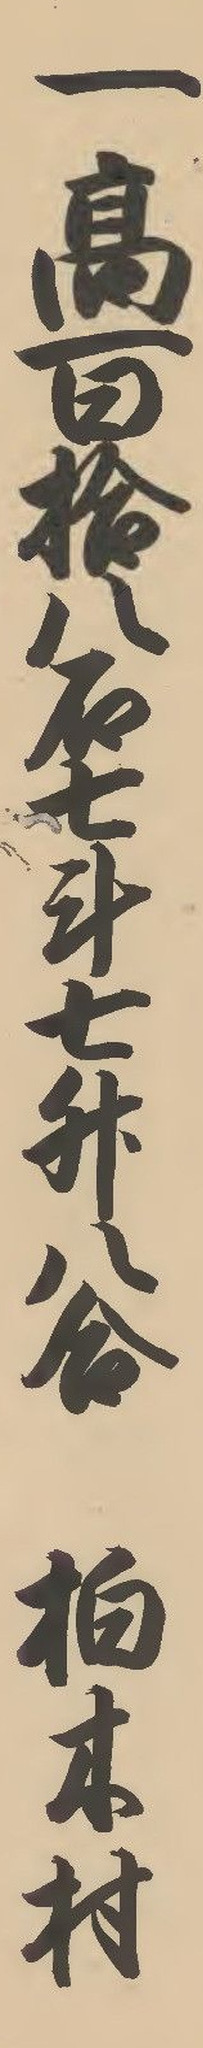一髙百拾八石七斗七升八合柏木村
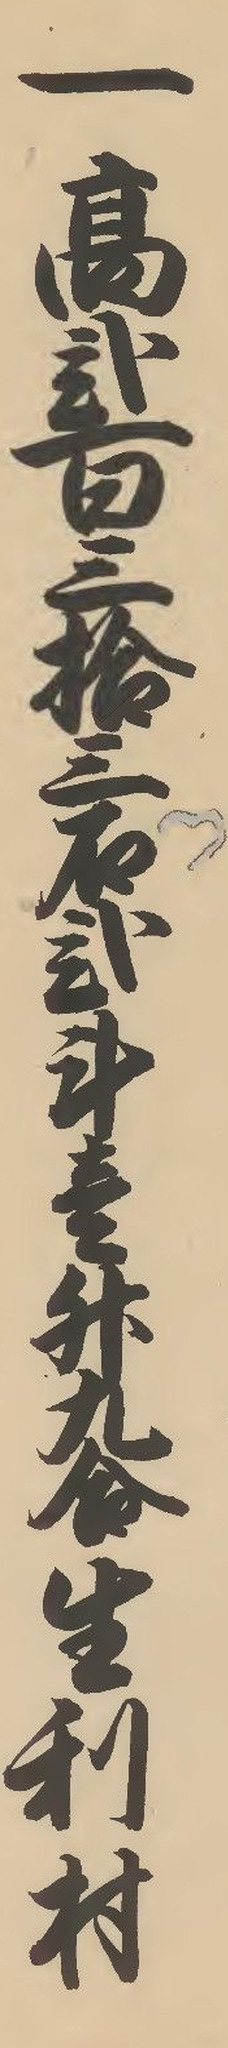一髙弐百三拾三石弐斗壱升九合生利村
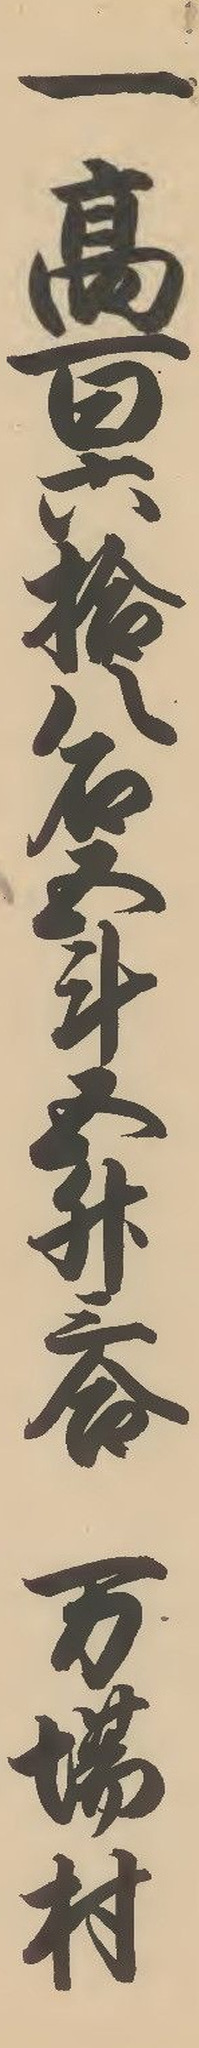一髙百六拾八石五斗五升三合万場村
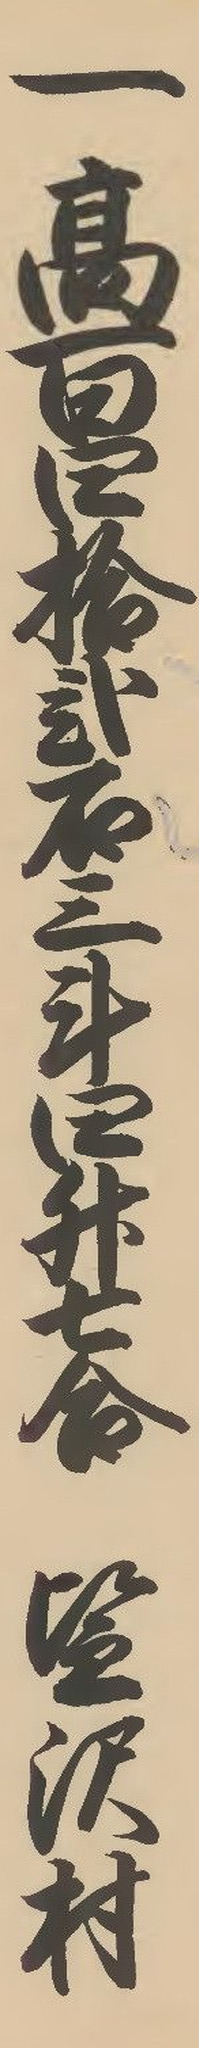一た百四拾弐石三斗四升七合塩沢村

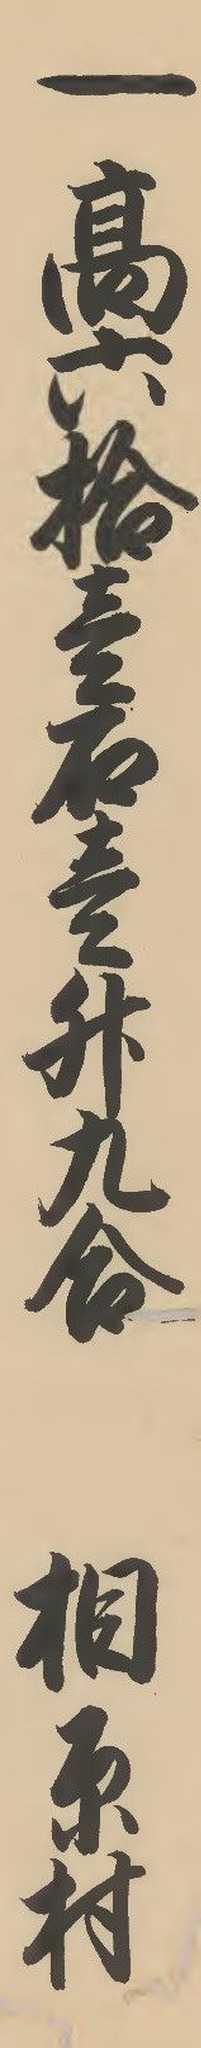一髙六拾壱石壱升九合相原村
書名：上野国郷帳
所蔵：国立公文書館 National Archives of Japan
